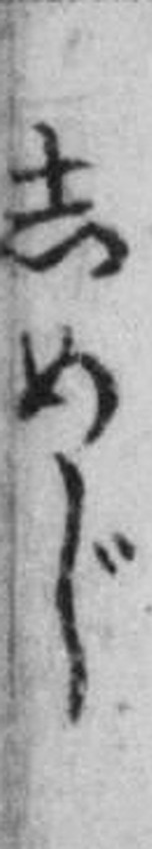しめじ
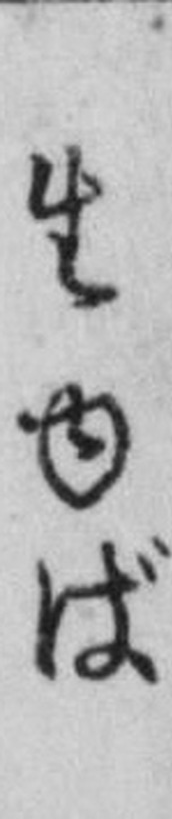結ゆば
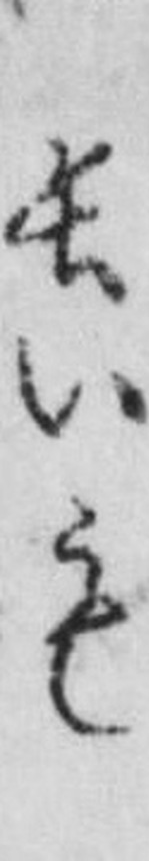小いも
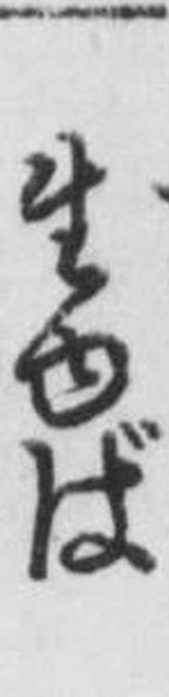結ゆば
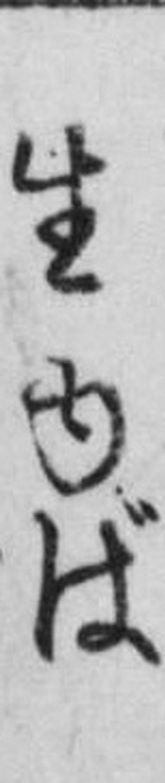結ゆば
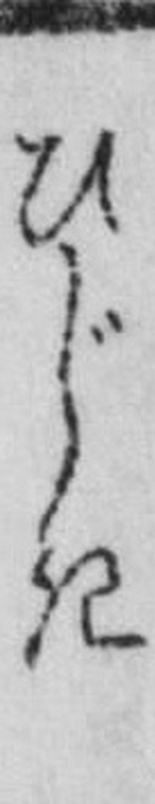ひじき
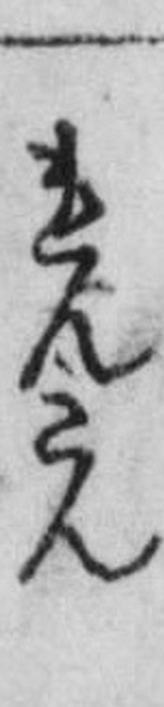れんこん
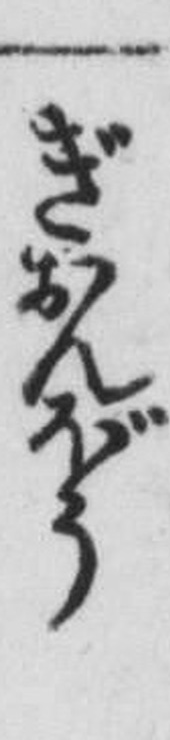きをんぼう
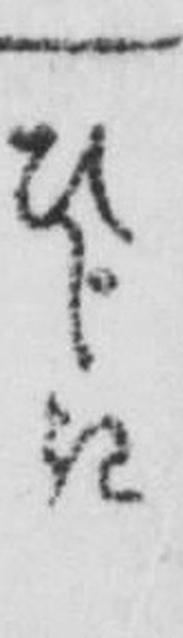ひじき
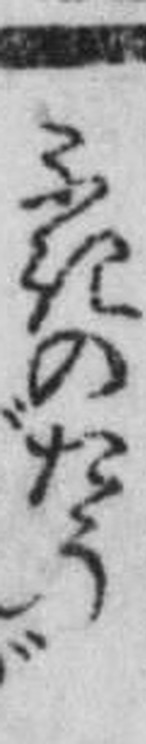ふきのたう
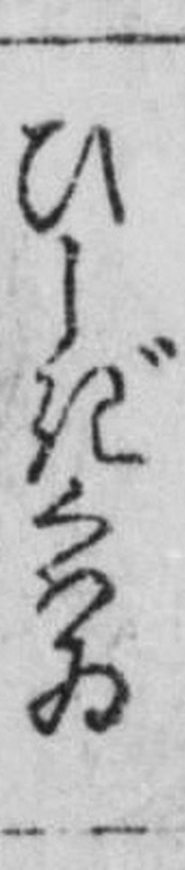ひしぎくはゐ
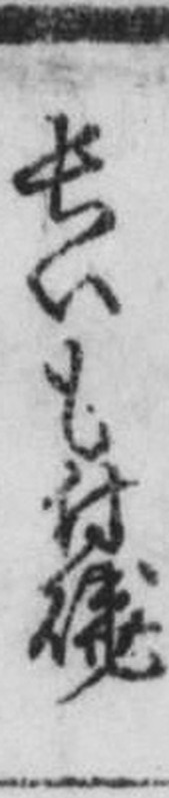長いも付焼
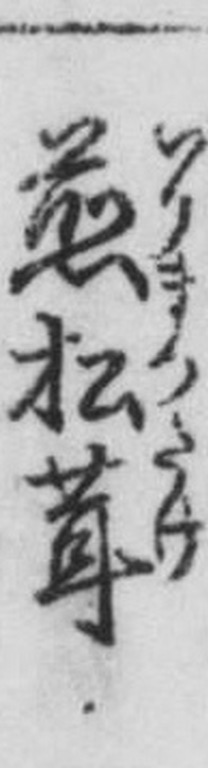煎松茸
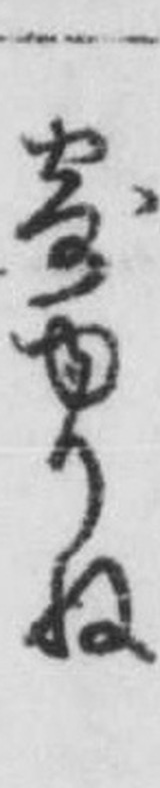寄ゆりね
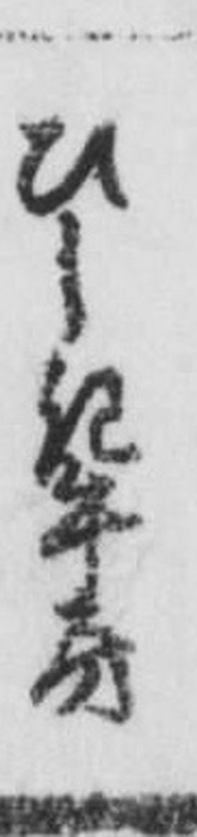ひしき牛蒡
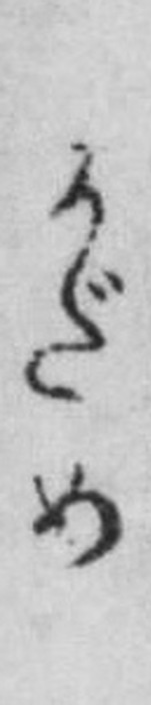かだめ
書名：精進魚類間合料理/早速庖丁
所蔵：大阪府立大学学術情報センター 国文学研究資料館
